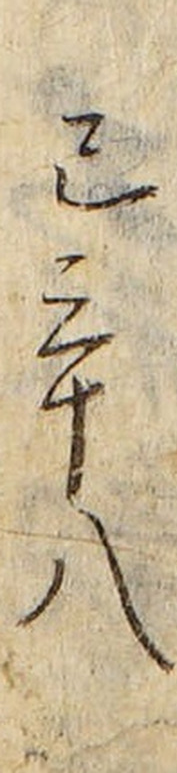巳三十八
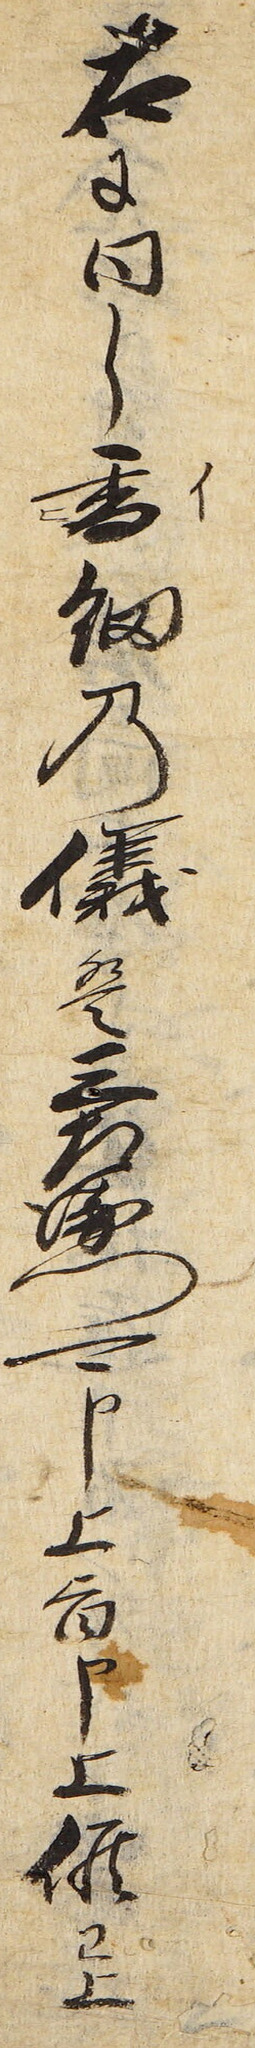右に同く委細の儀は三左衛門可申上旨申上候已上

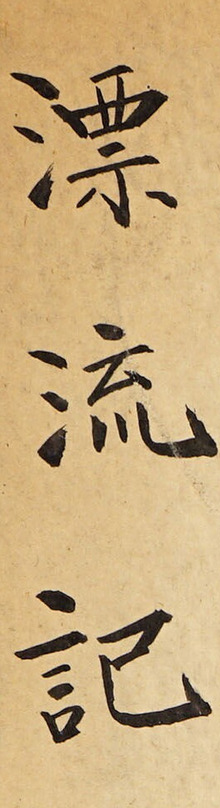漂流記
